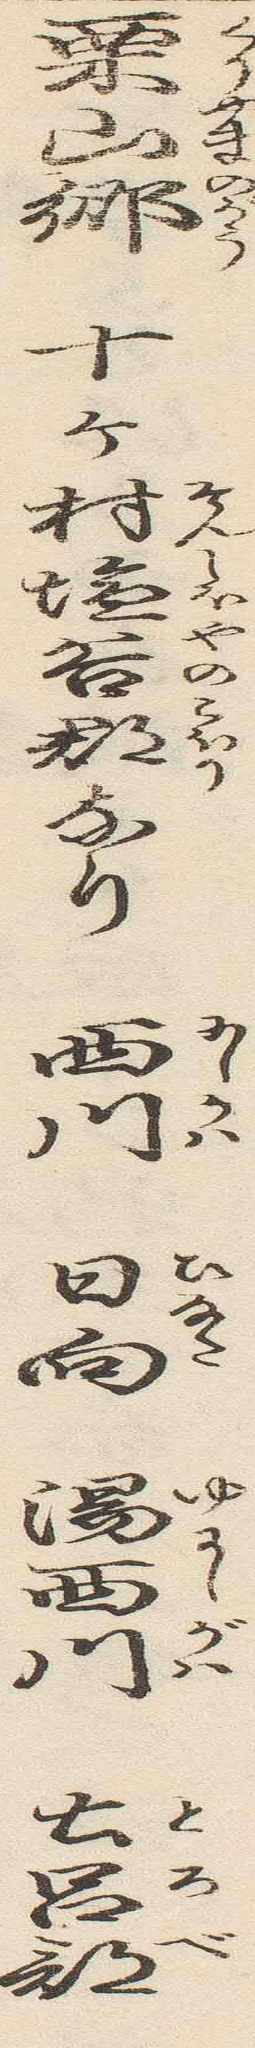栗山郷十ヶ村塩谷郡なり西川日向湯西川土呂部
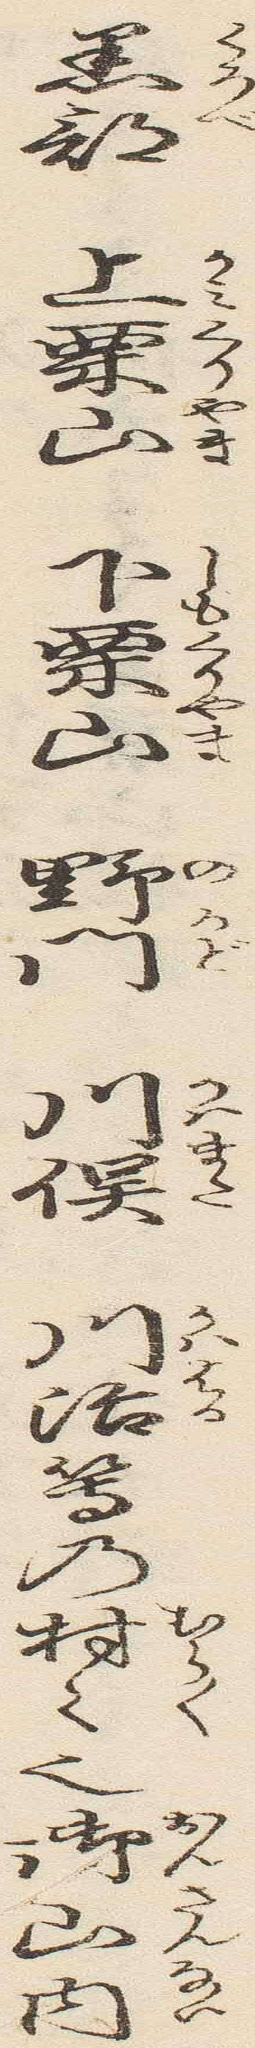黒部上栗山下栗山野門川俣川治等の村〻也御山内
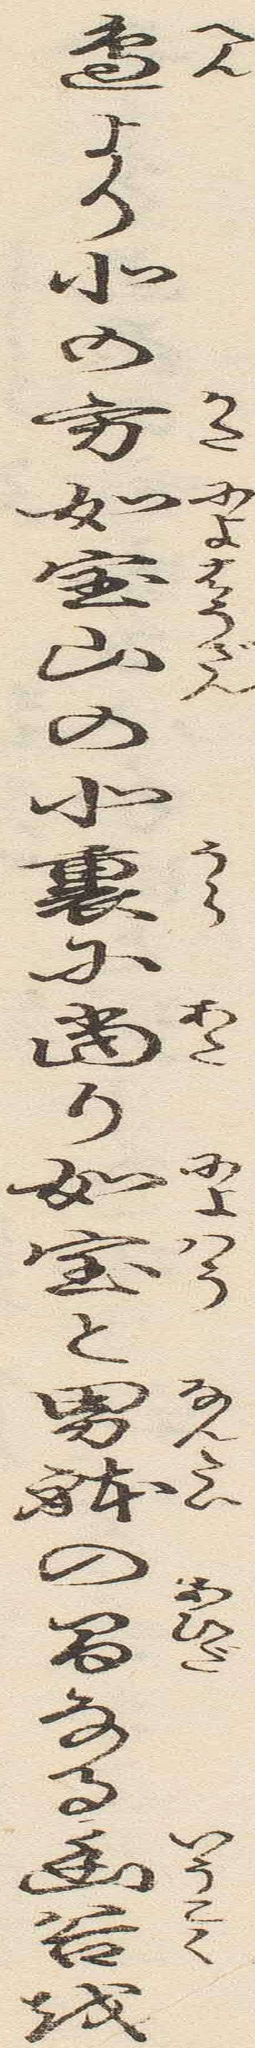邊より北の方如宝山の北裏に當り如宝と男躰の間なる幽谷を
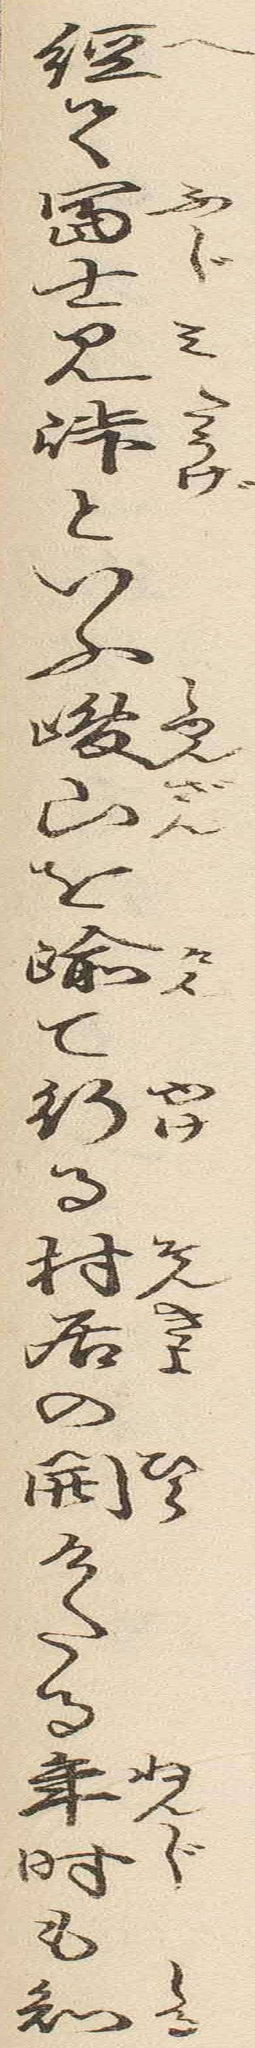經て冨士見峠といふ峻山を踰て行る村居の開けたる年时も知
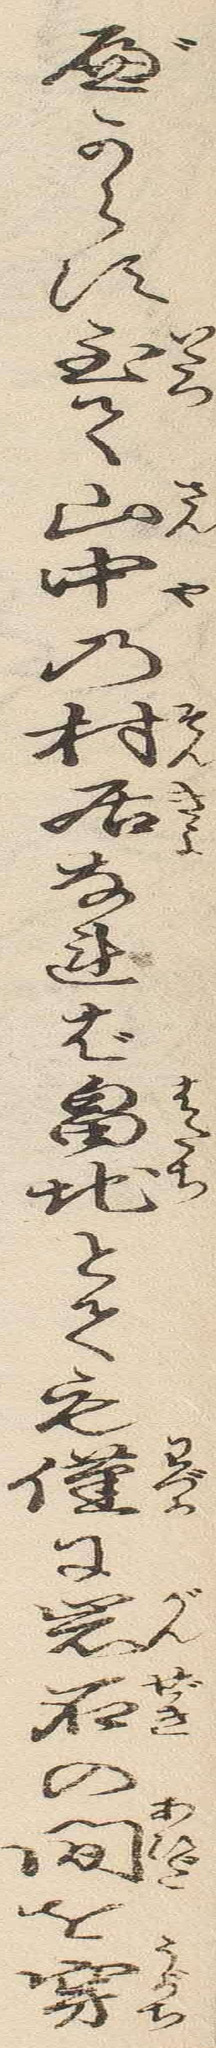べからす至て山中の村居なれば畠地とても僅に岩石の間を穿
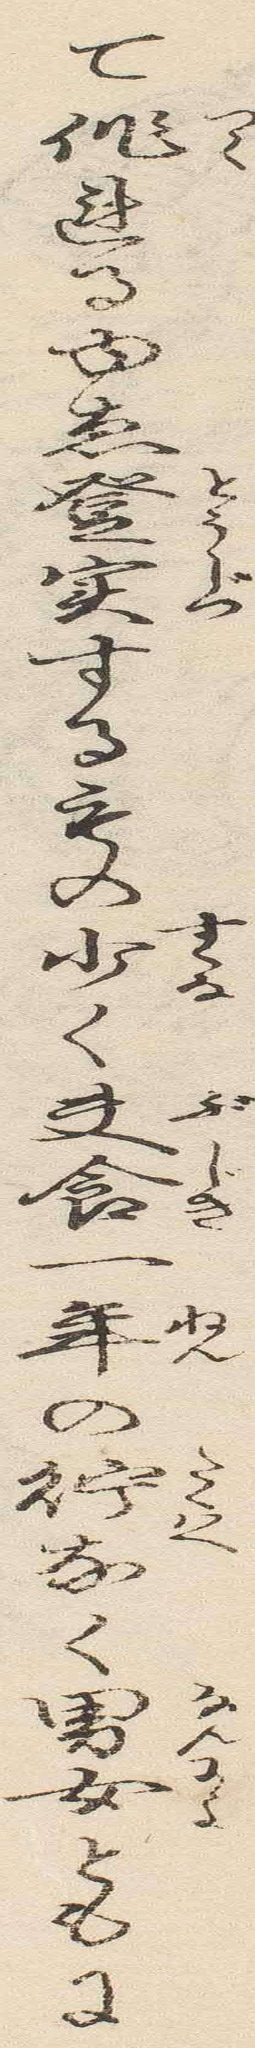て作れるゆゑ登実するもの少く夫食一年の貯なく男女ともに
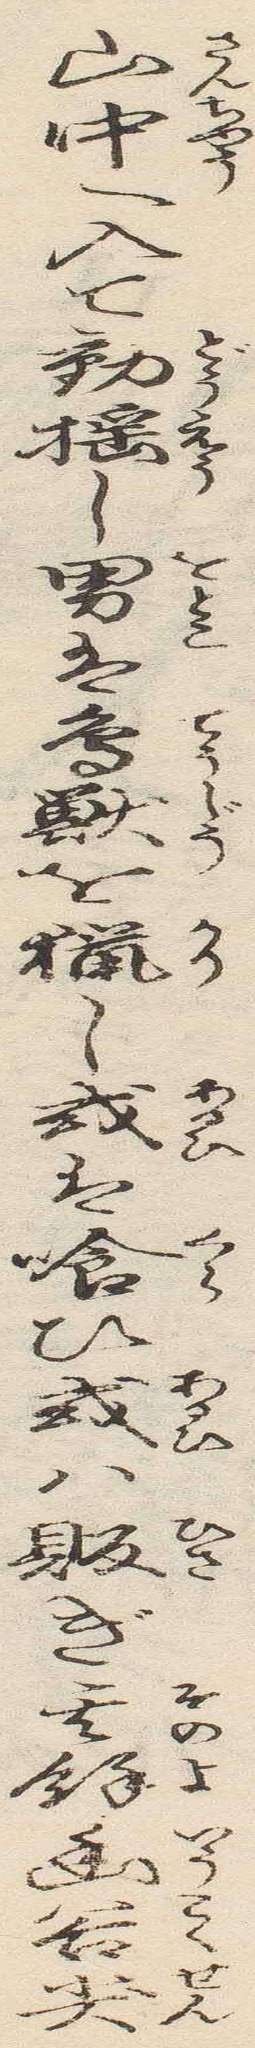山中へ入て動揺し男は鳥獣を猟し或は喰ひ或は販ぎ其餘幽谷尖
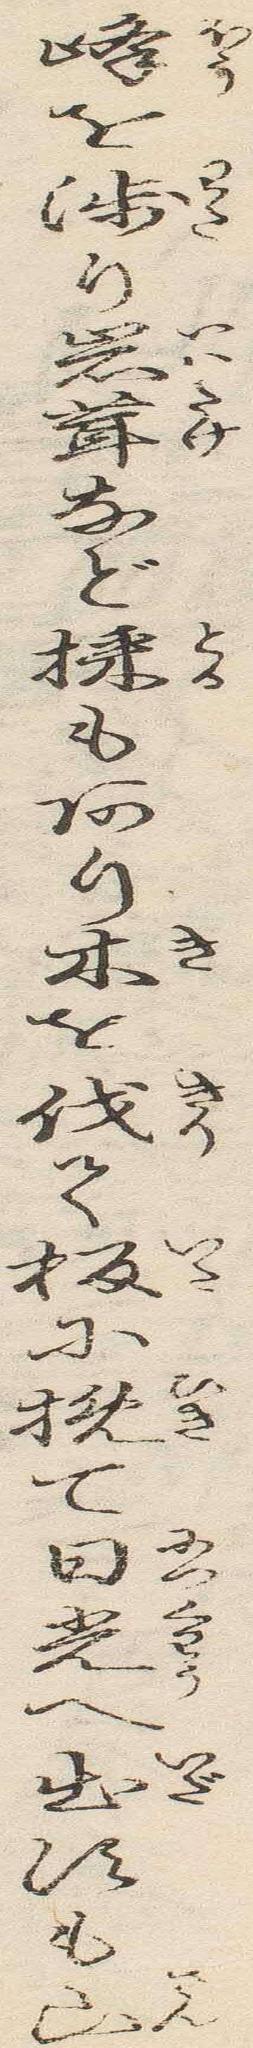峰を渉り岩茸など採もあり木を伐て板に挽て日光へ出すも山
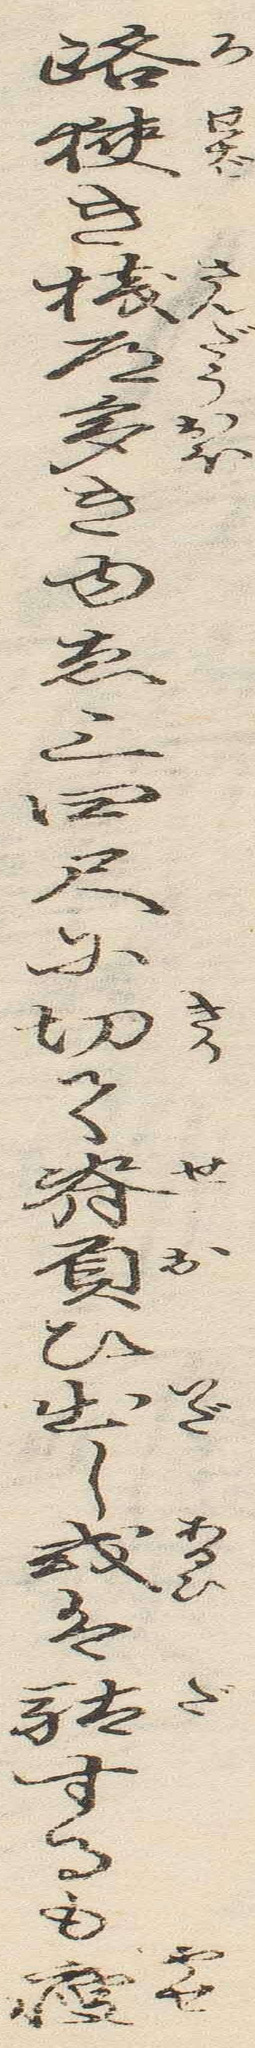路狹き棧道多きゆゑ三四尺に切て脊負ひ出し或は駄するも痩
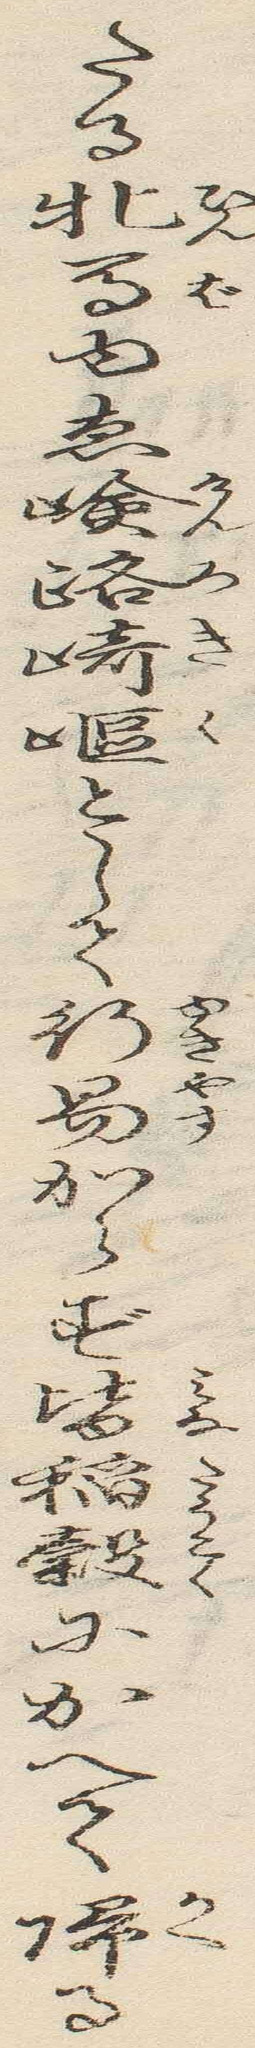たる牝馬ゆゑ𡸴路﨑嶇として行易からず皆稲穀にかへて帰る
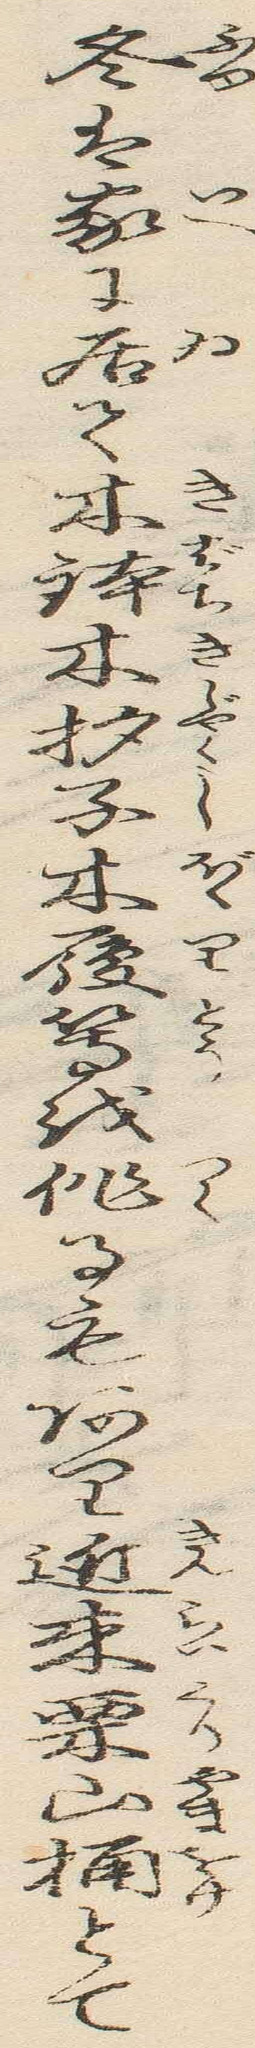冬は家に居て木鉢木𪭜子木履等を作るもあり近來栗山桶とて
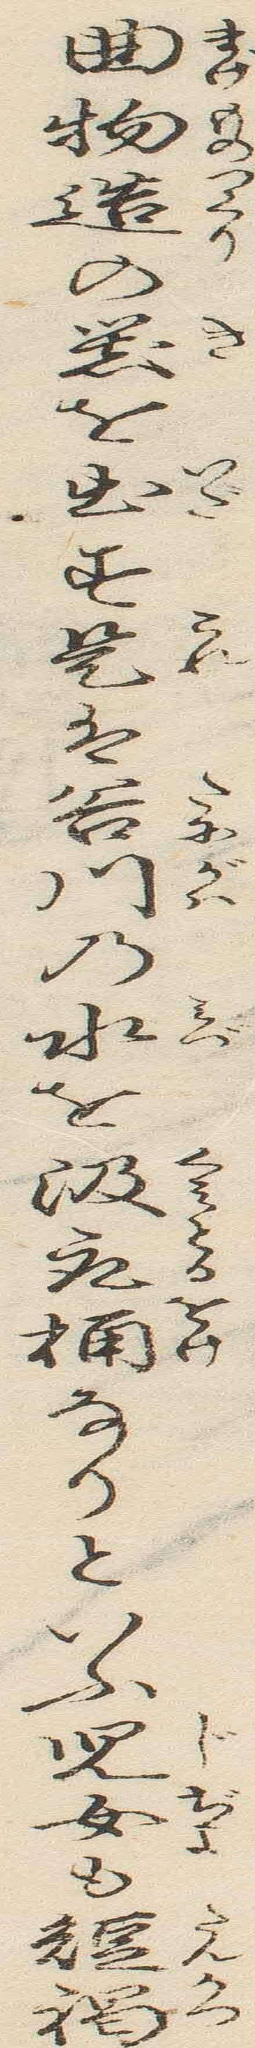曲物造の器を出す是は谷川の水を汲取桶なりといふ児女も短褐
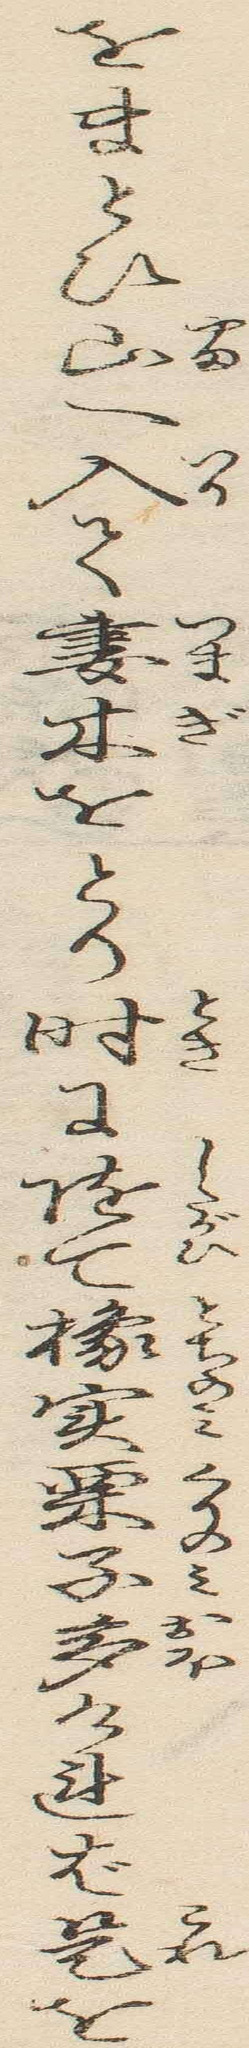をまとひ山へ入て妻木をとり时に随て橡実栗子多ければ是を
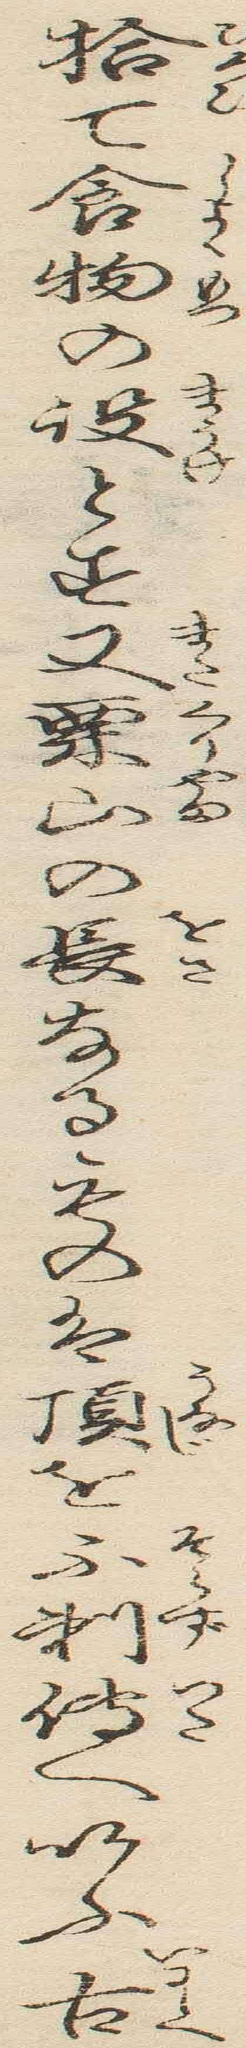拾て食物の設とす又栗山の長なるものは項を不剃傳へいふ古
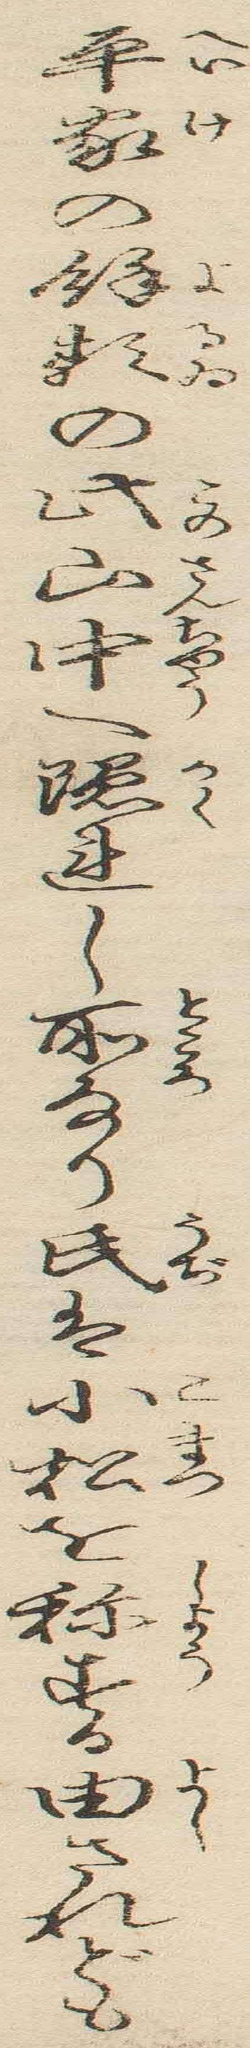平家の餘類の此山中へ隠れし所なり氏は小松を称する由されども
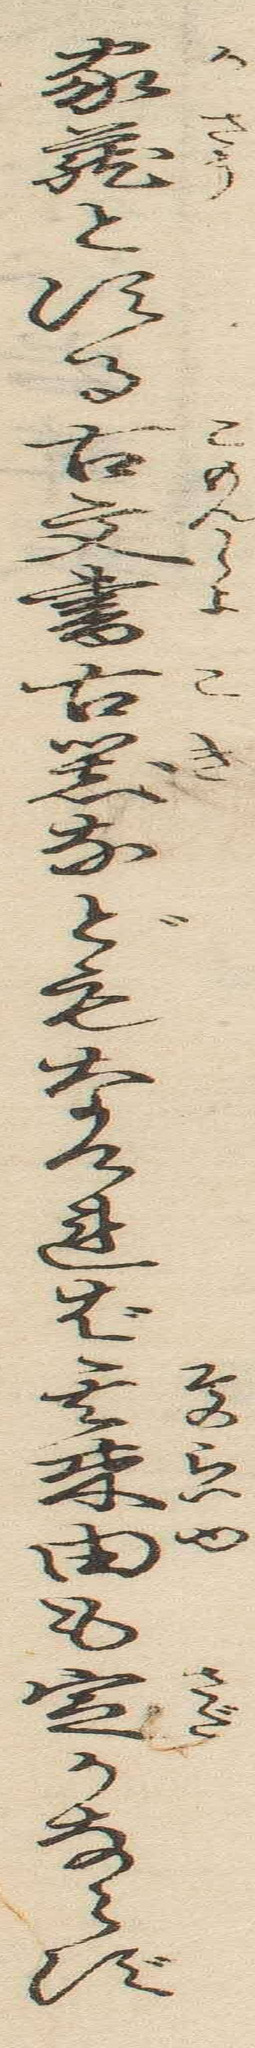家蔵とする古文書古器などもなければ其來由も定かならず
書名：日光山志
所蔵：東京学芸大学附属図書館 国文学研究資料館
